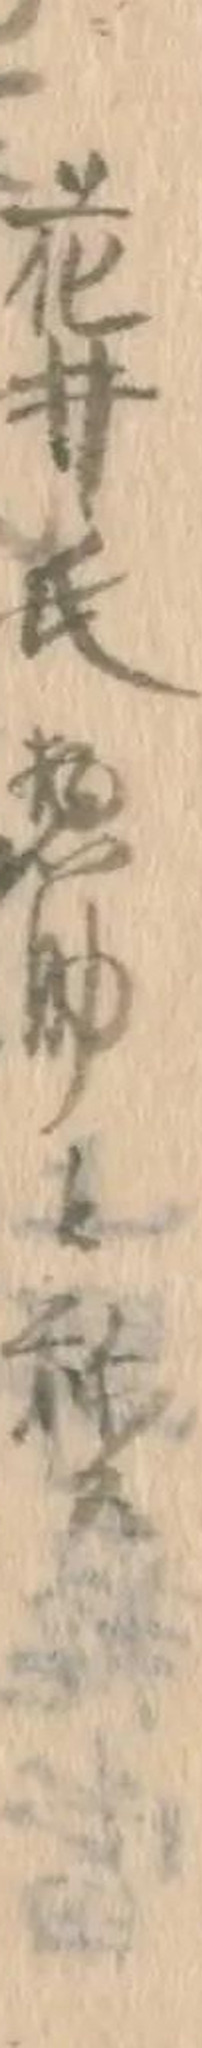花井氏惣助と称ス
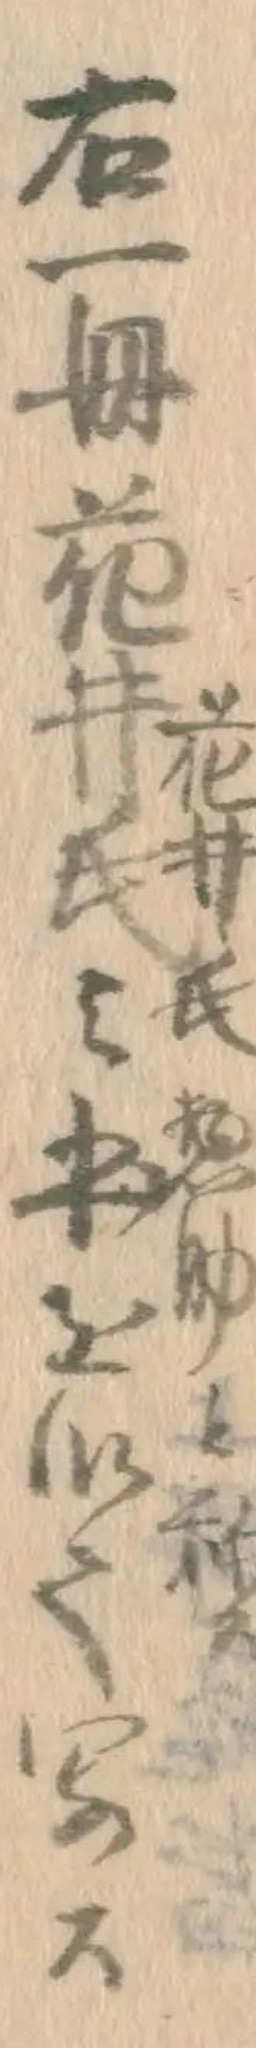右一冊花井氏之書を以て写ス
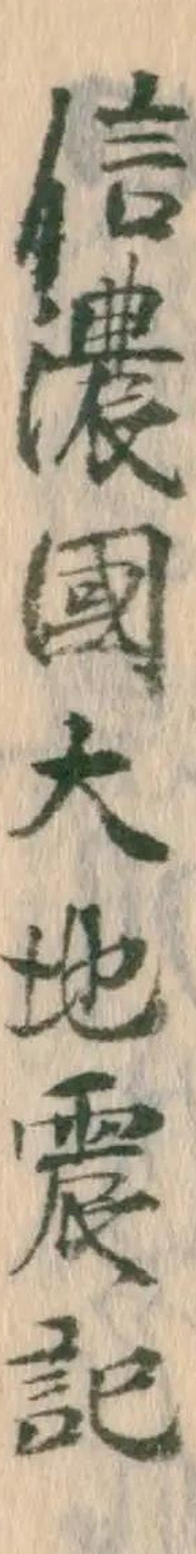信濃国大地震記
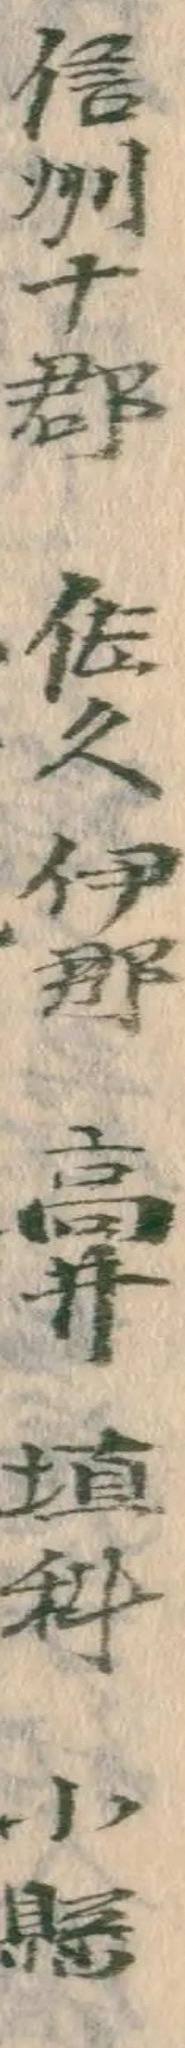信州十郡佐久伊那高井埴科小県
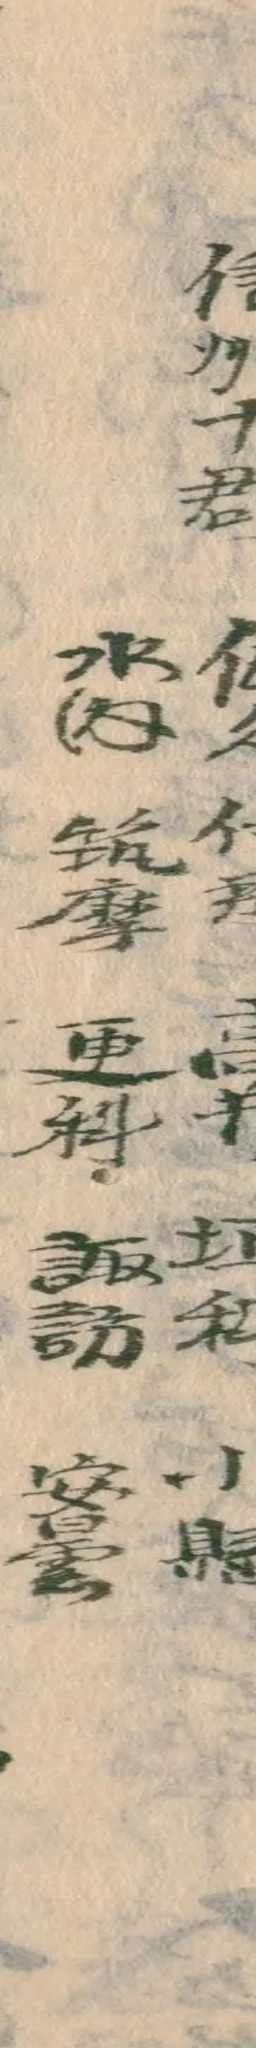水内筑摩更科諏訪安曇
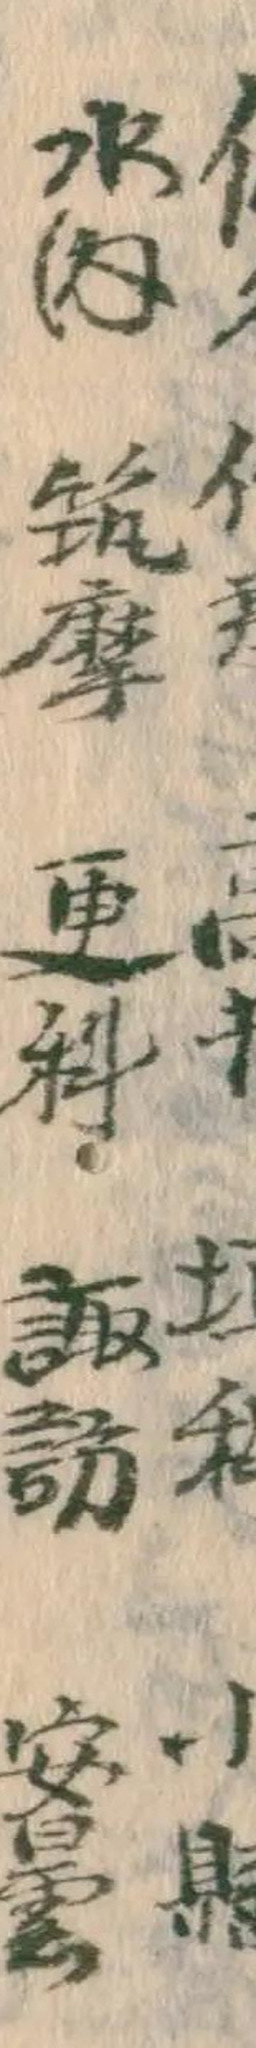水内筑摩更科諏訪安曇
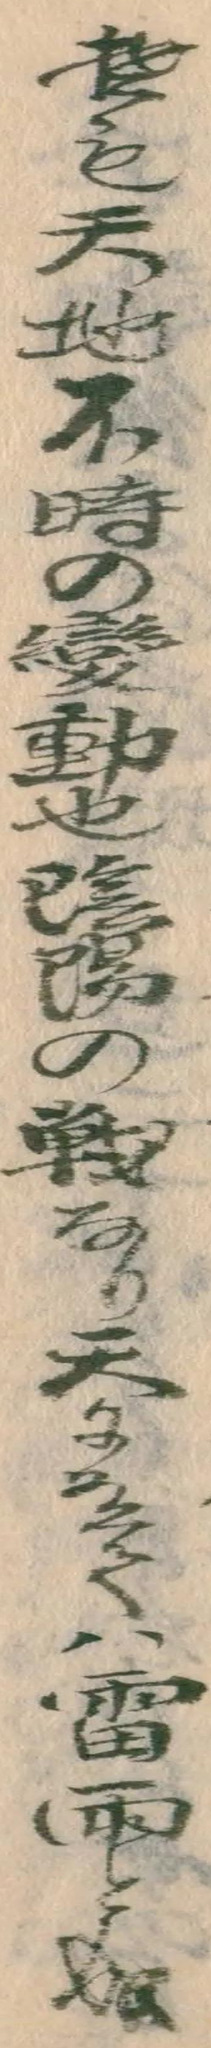そも天地不時の変動也陰陽の戦なり天に有てハ雷雨と成
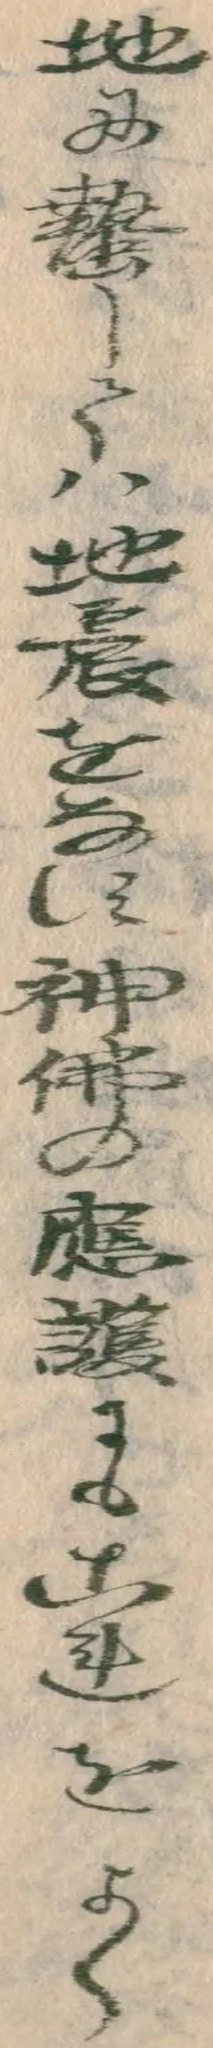地に蟄してハ地震をなす神仏の應護にもこれをよく
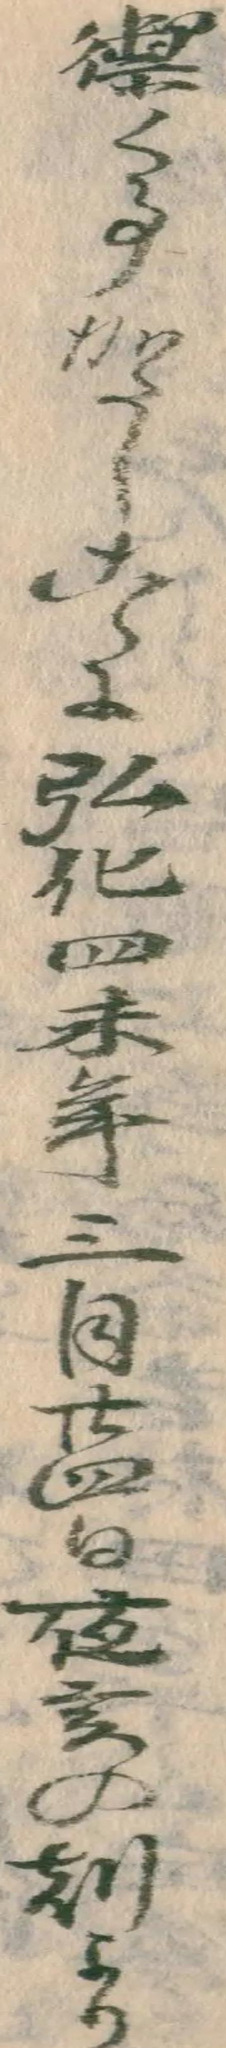禦く事かたしこゝに弘化四未年三月廿四日夜亥の刻より
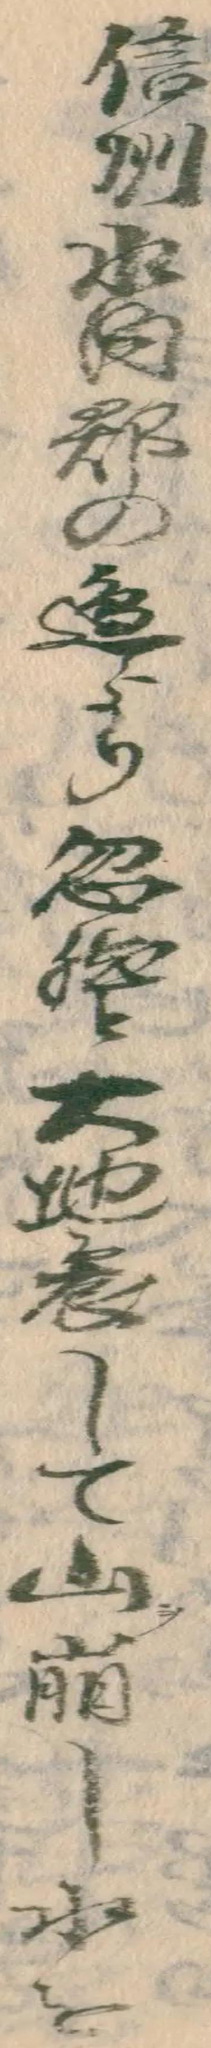信州水内郡の辺より忽然と大地震して山崩し水を
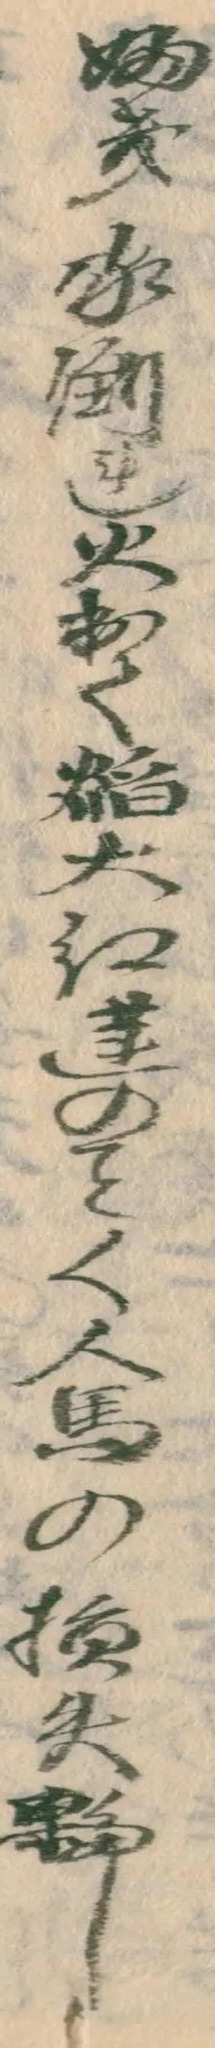ふき家れ火出て焔大紅蓮のことく人馬の損失夥し
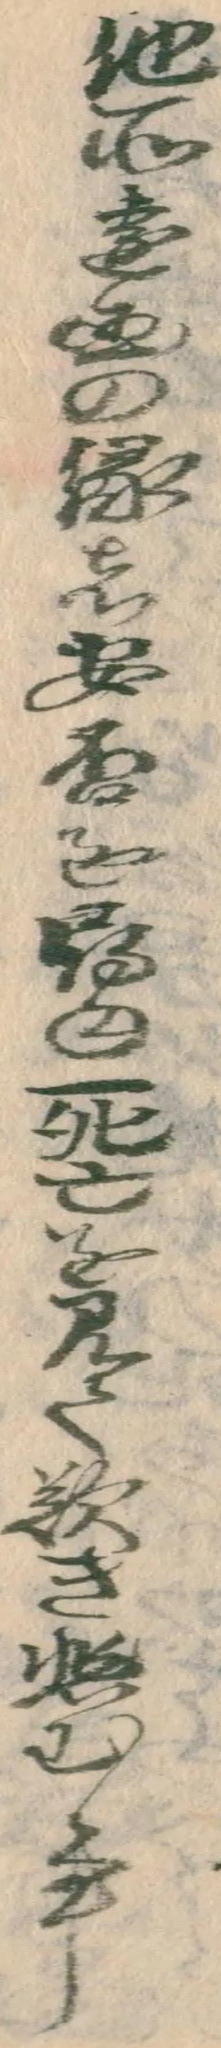他所遠国の縁者安否を尋ね死亡を見て嘆き憐む事
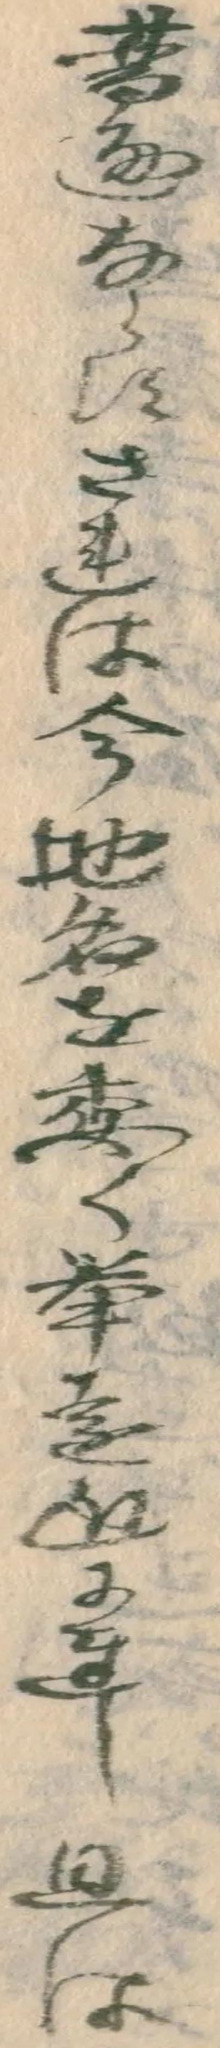普通ならすされは今地名を悉く挙遠近に達し且は
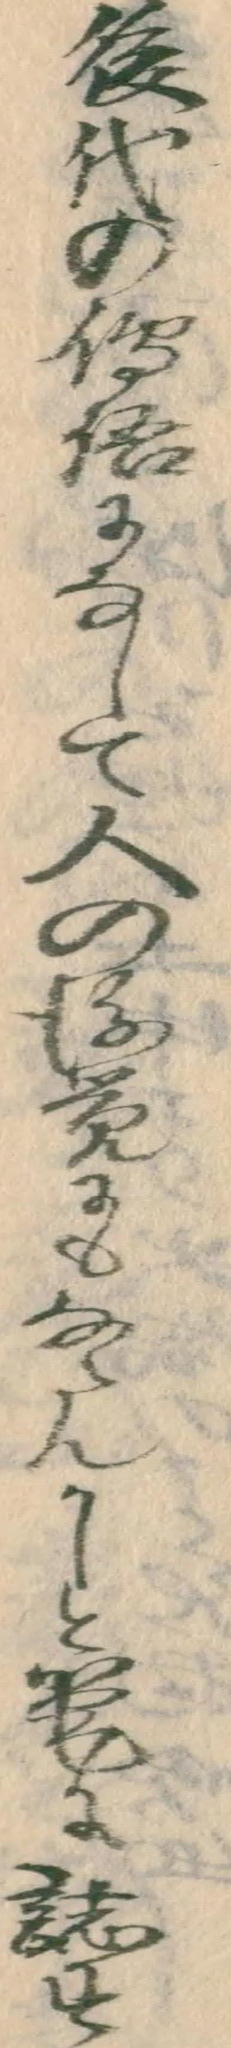後代の伝語になして人の後覚にもならんかと筆に誌す
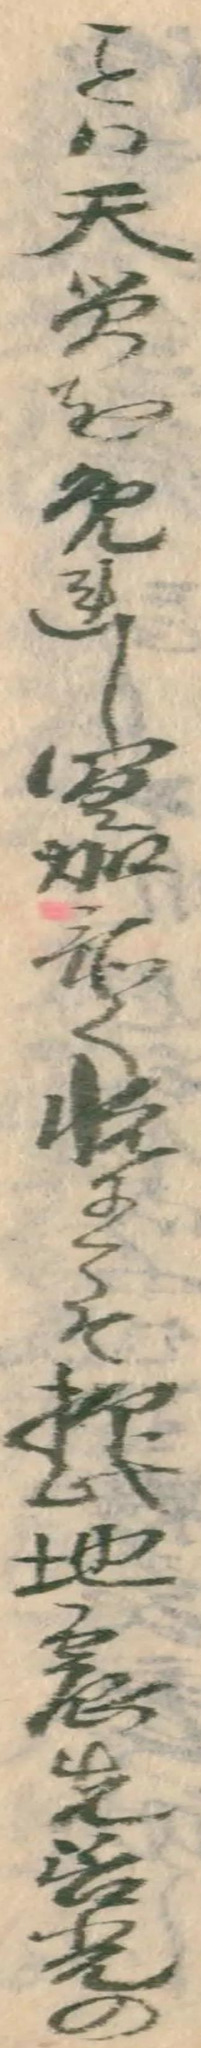ことハ天災を免れし冥加恐悦にこそ抑此地震先善光の

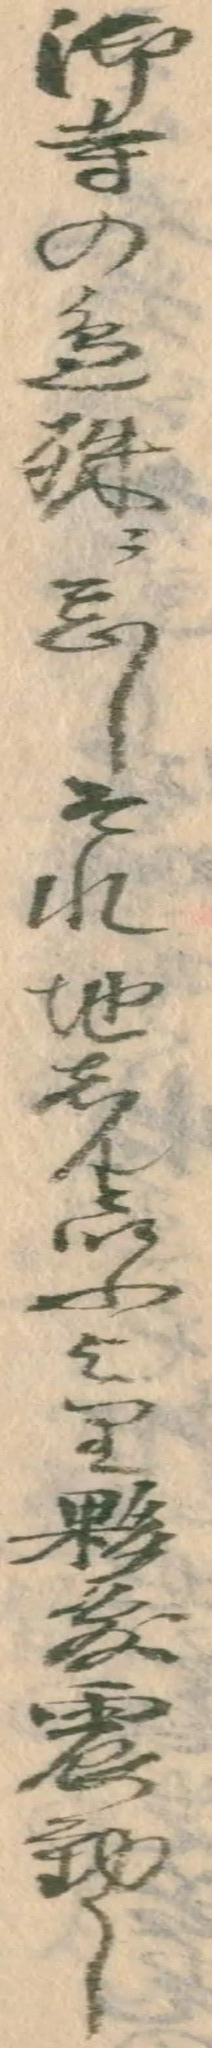御寺の辺殊二甚しそれ地しんといふより夥敷震動し
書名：信州大地震之記
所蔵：国立国会図書館 National Diet Library, JAPAN
